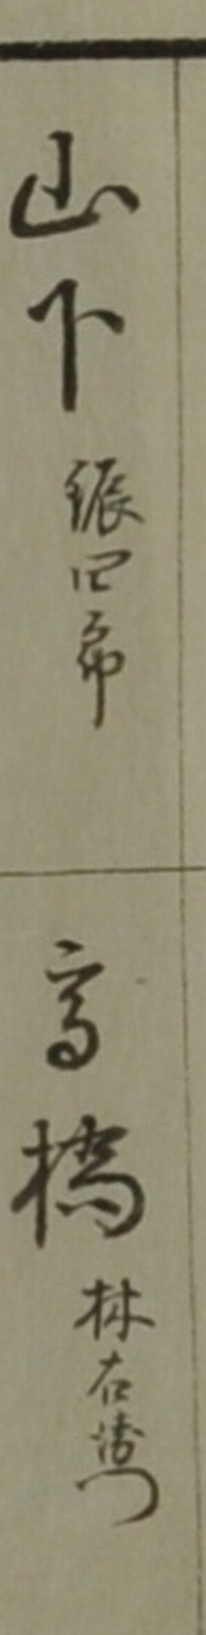山下鋠四郎高橋林右衛門
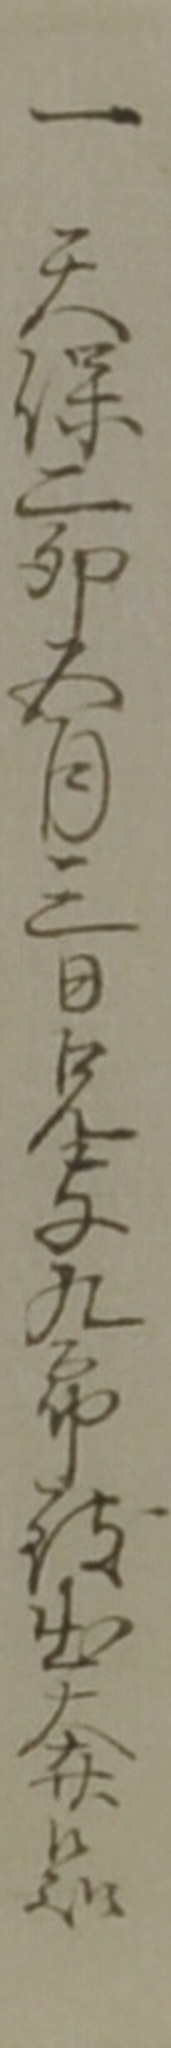一天保二卯五月三日兄与九郎致出奔候処
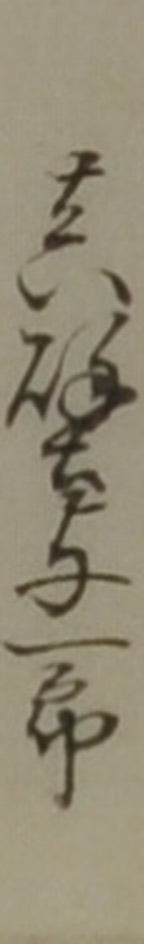真壁与一郎
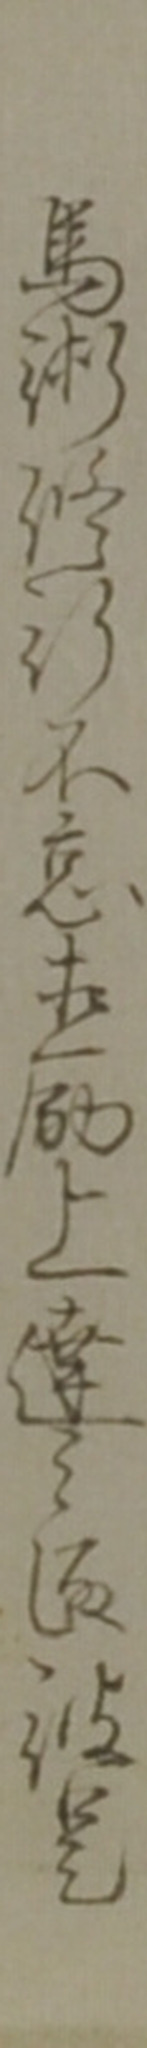馬術修行不怠相励上達之趣彼是
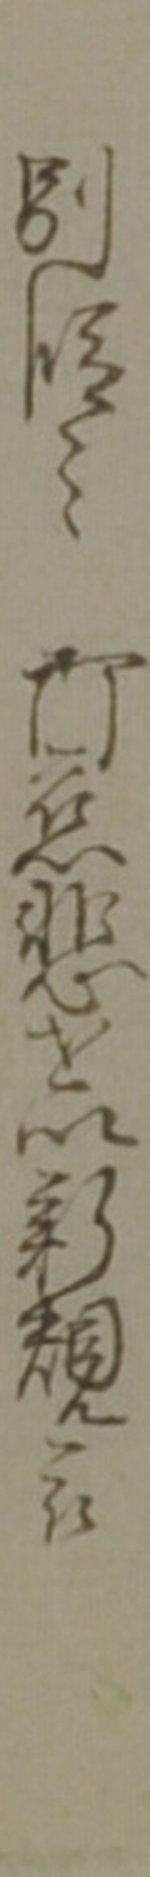別段之御慈悲を以新規被
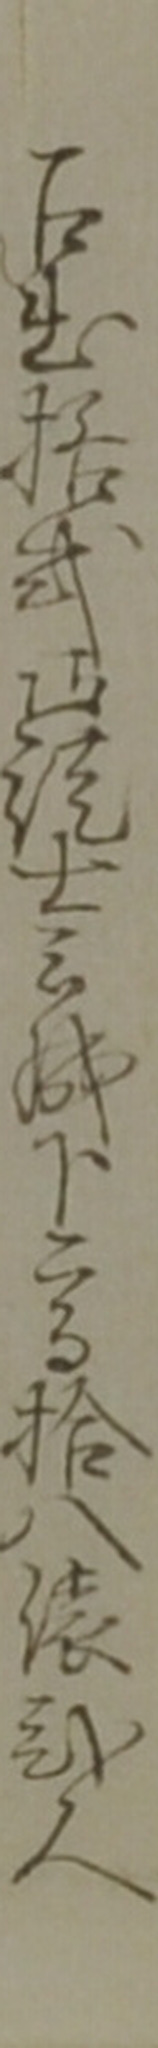召出格式御徒士被成下高拾八俵弐人
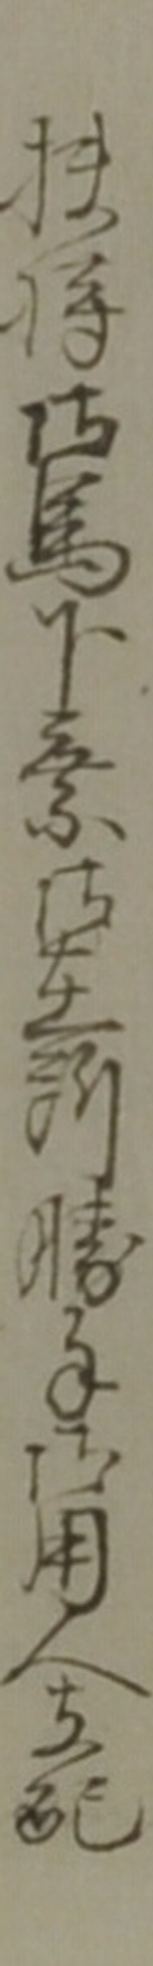扶持御馬下乗御在所勝手御用人支配
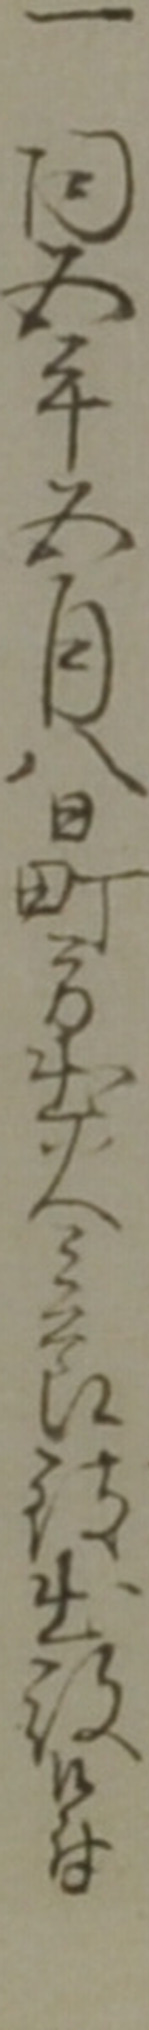一同五午五月八日町方出火之節致出役候付
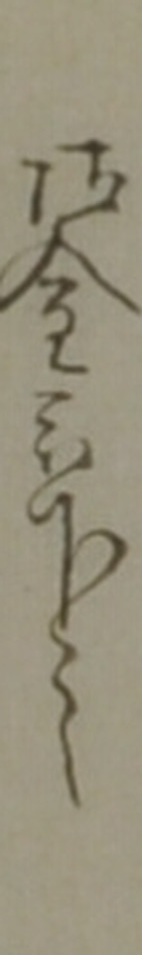御金被下之
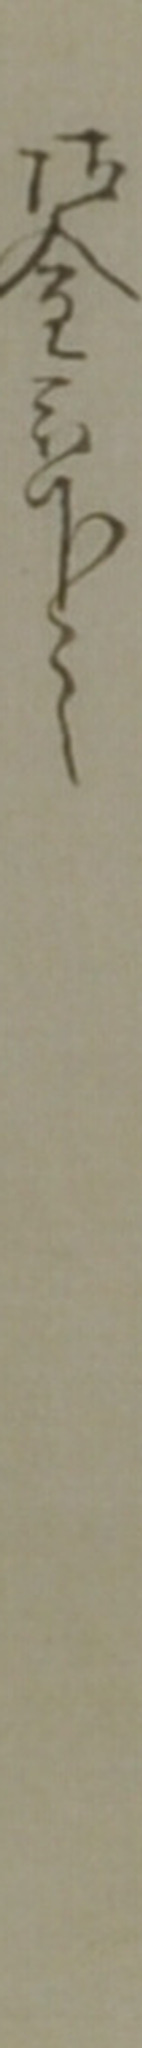御金被下之
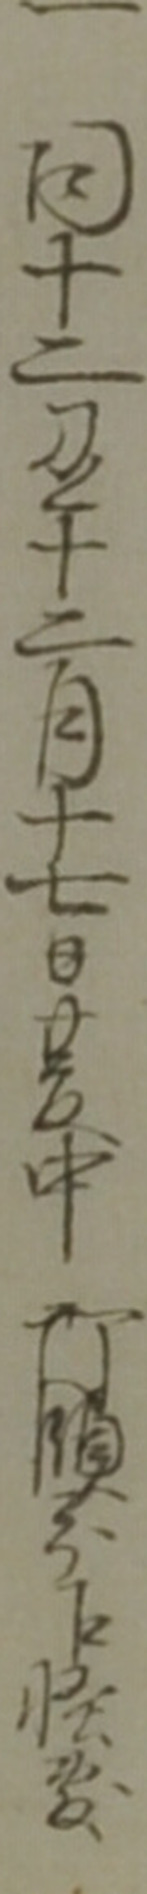一同十二丑十二月十七日夏中御領分江怪敷
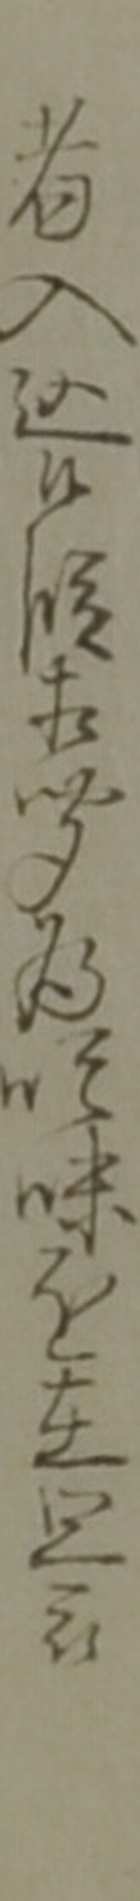者入込候段相聞為吟味近在廻被

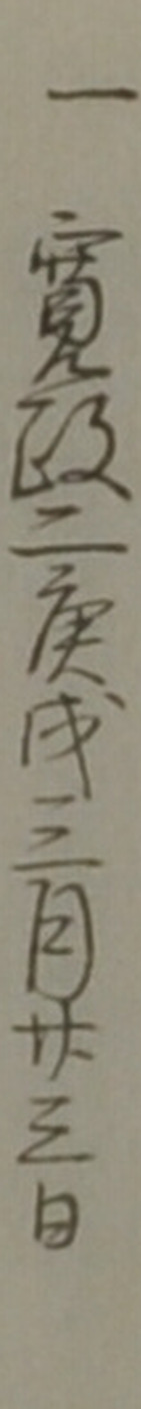一寛政二庚戌三月廿三日
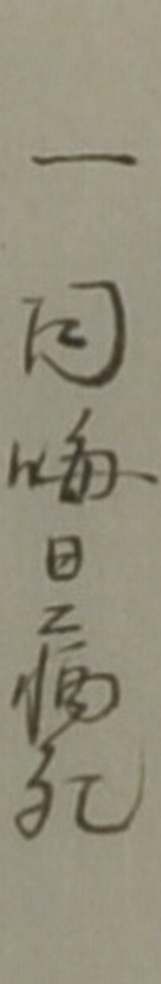一同晦日病死
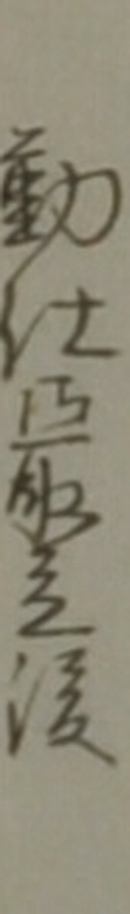勤仕御取立後
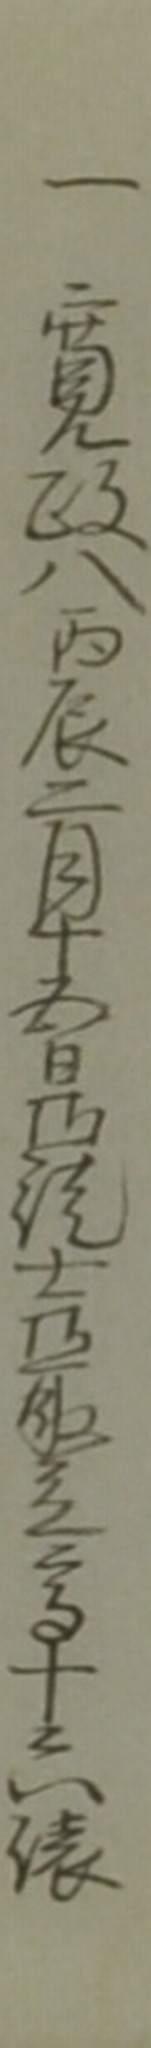一寛政八丙辰二月十五日御徒士御取立高十六俵
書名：無足諸士勤仕録（八）
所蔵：伊那市立高遠町図書館・合同会社AMANE
